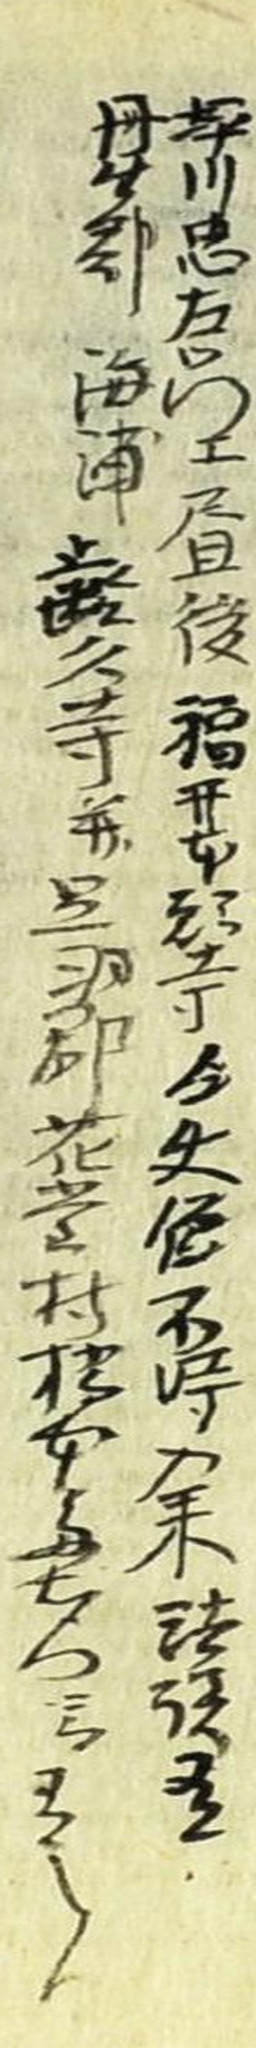丹生郡海浦年齢久寺幷足羽郡花堂村橋本多右衛門ニ而有之候
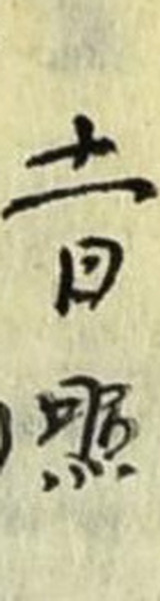十一日照
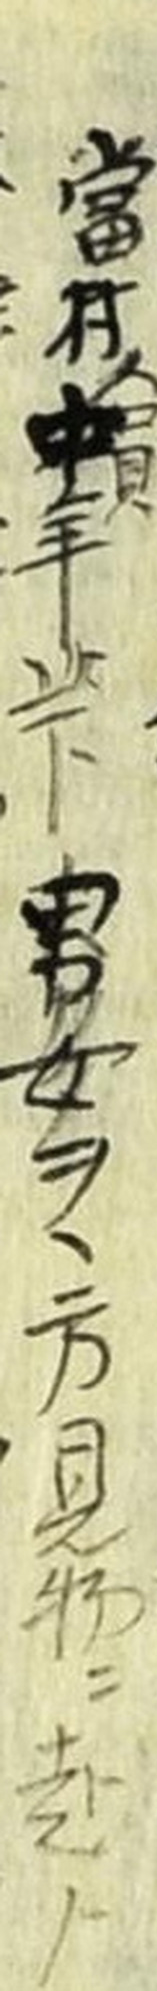当村人員中年以下男女ヲヽ方見物ニ赴候
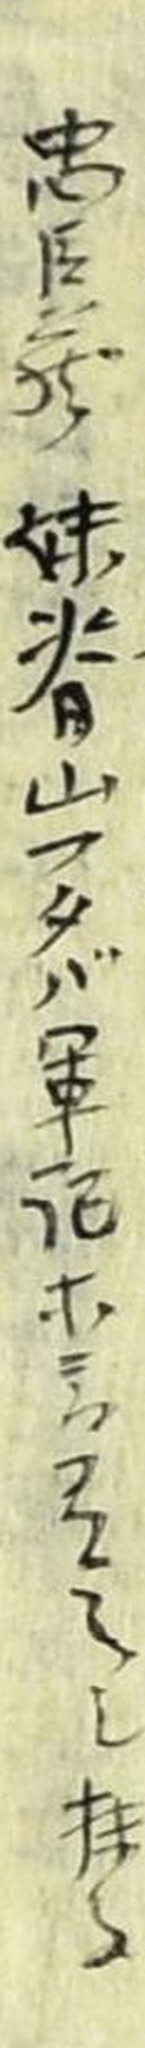忠臣蔵妹背山フタバ軍記等ニ而有之候様子
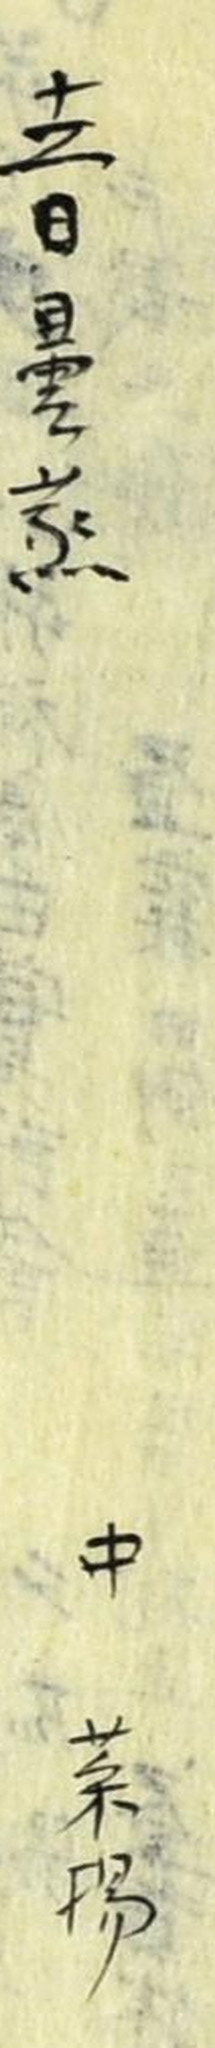十二日曇蒸中菜揚
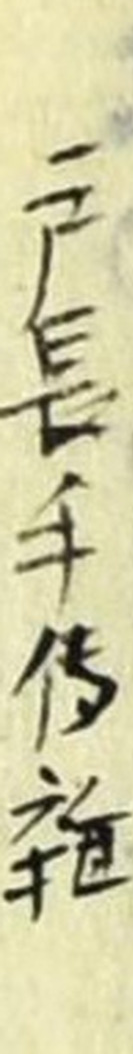戸長手伝雑
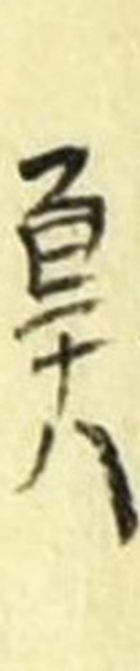百二十八
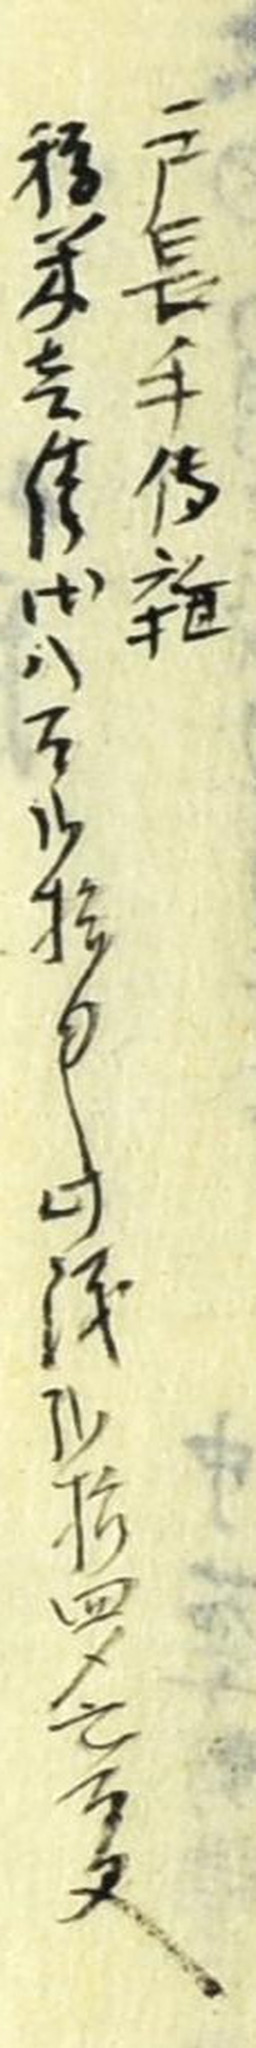糯米壱俵代八百弐拾匁此銭弐拾四貫六百文
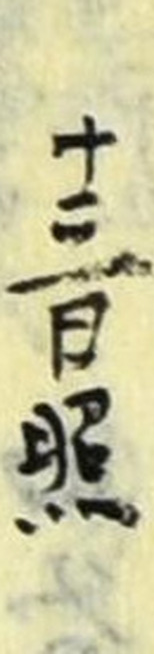十一日照

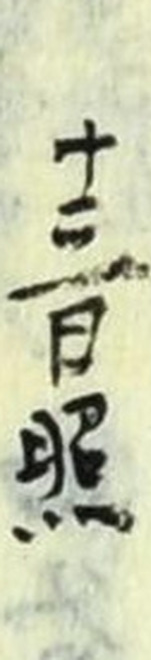十三日照
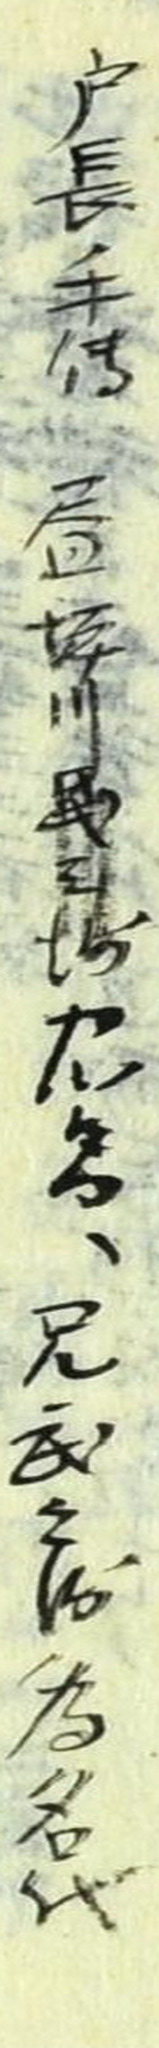戸長手伝昼坪川「武兵衛」忠左衛門へ兄武兵衛為名代
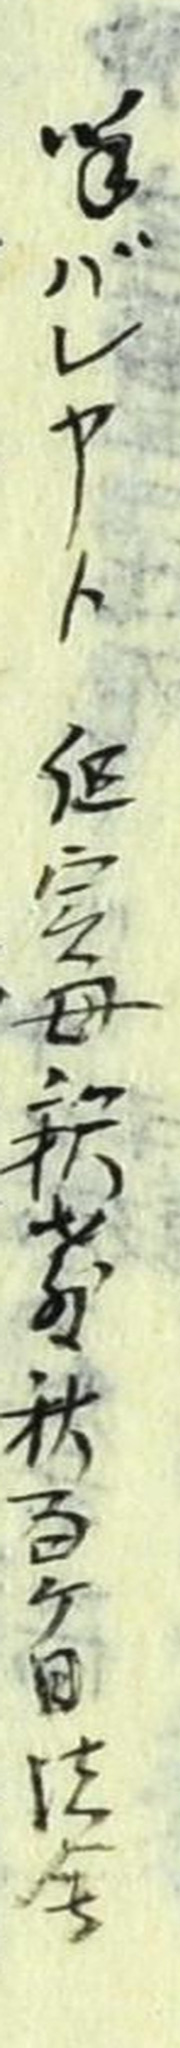呼バレ申候但実母釈教秋百ヶ日法会
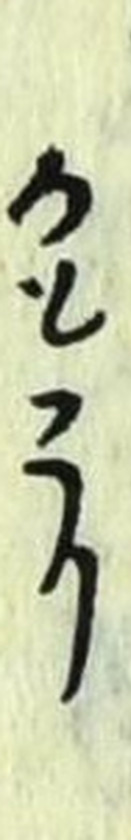かもうり
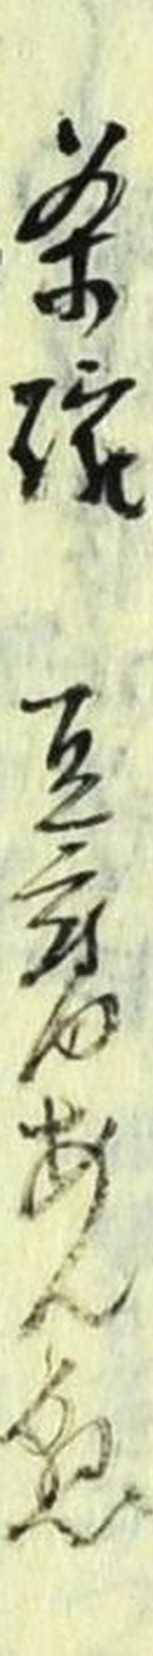茶碗豆腐あん懸
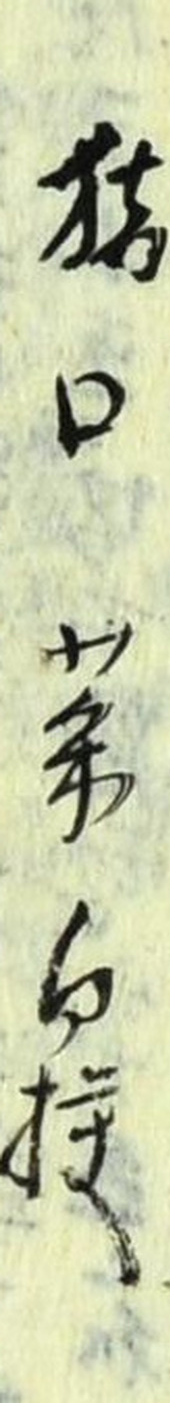猪口菜白挟
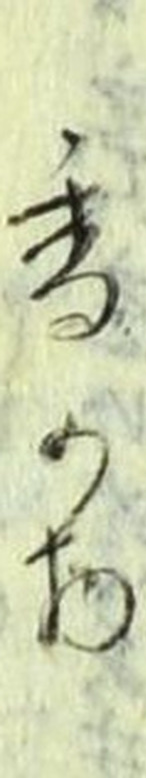香の物
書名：（日記）
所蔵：福井県文書館 Fukui Prefectural Archives
